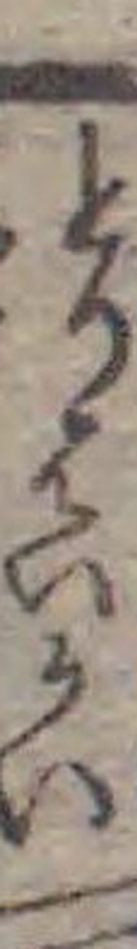とりはいかい
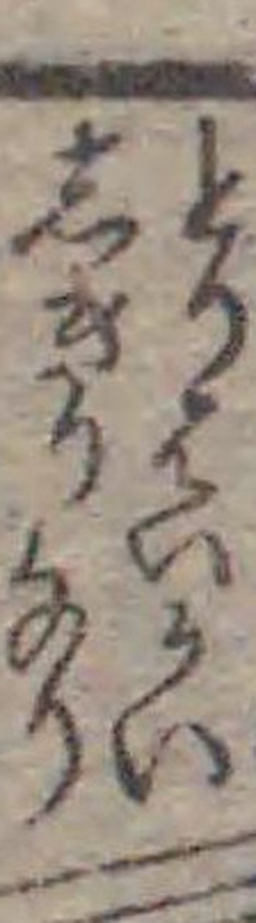しきりなり
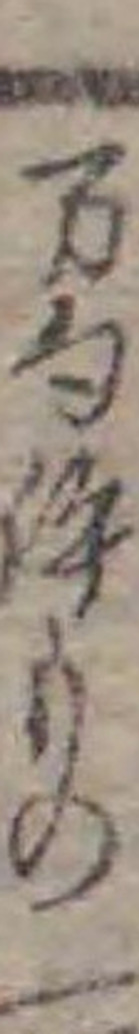万句評もの
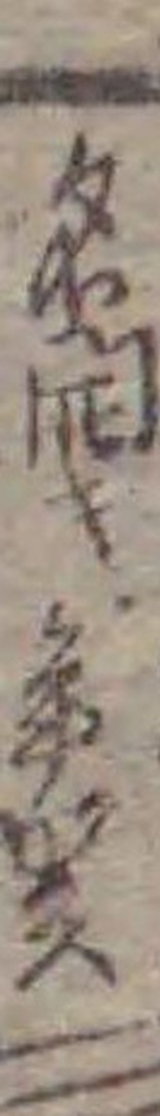名開き年賀
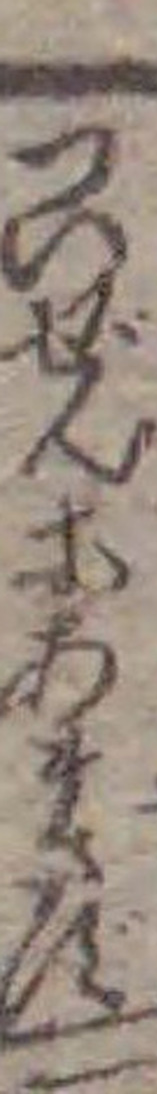ついぜん等あまさず
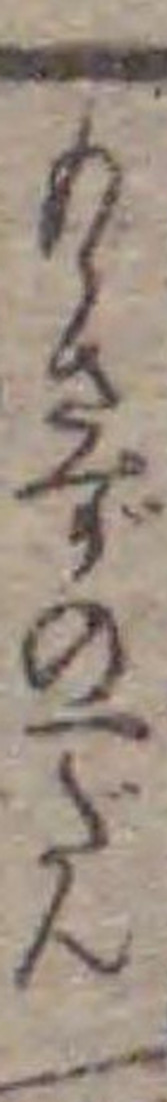もらさずの一だん
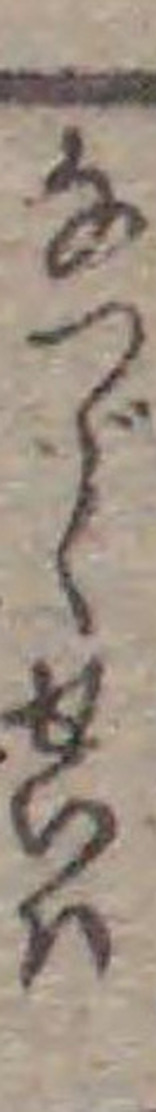なつゞくせいは
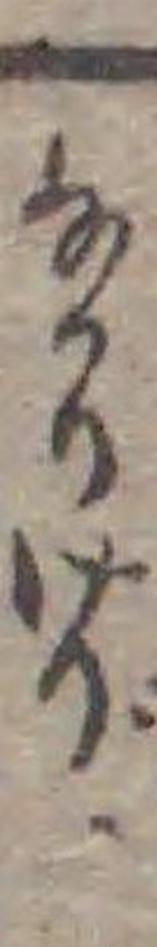なかりけり

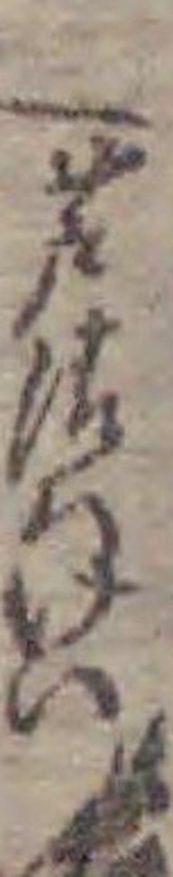芦清はけい
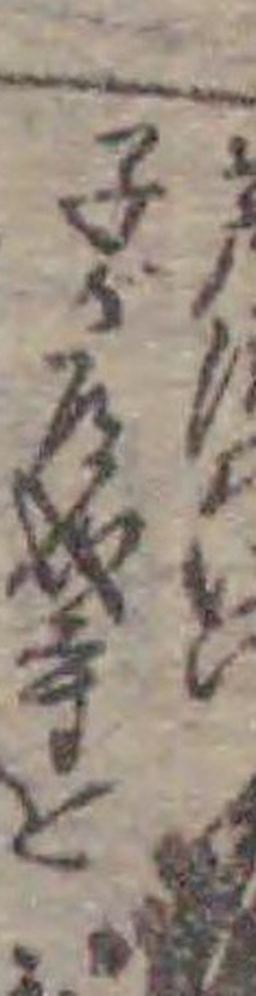子が道成寺を
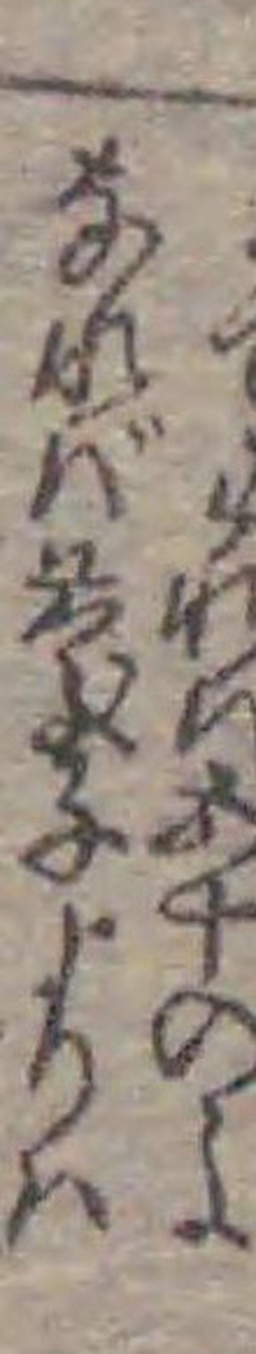なれば慶子よりは
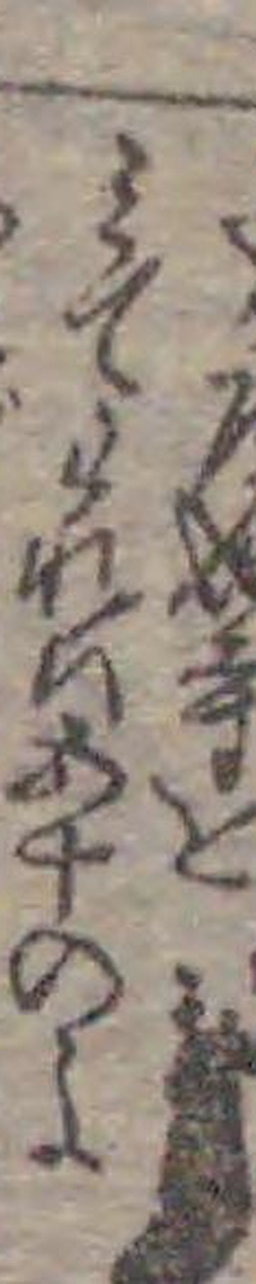みてわれは五十のよ
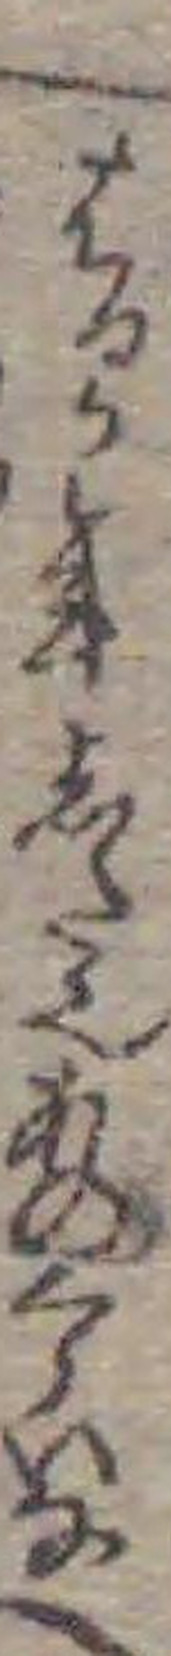はるか年した也あのくらいな
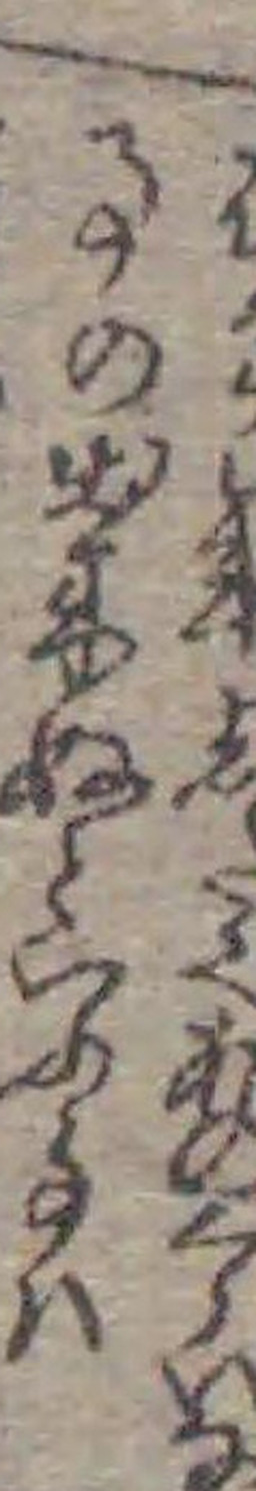事の出来ぬといふ事は
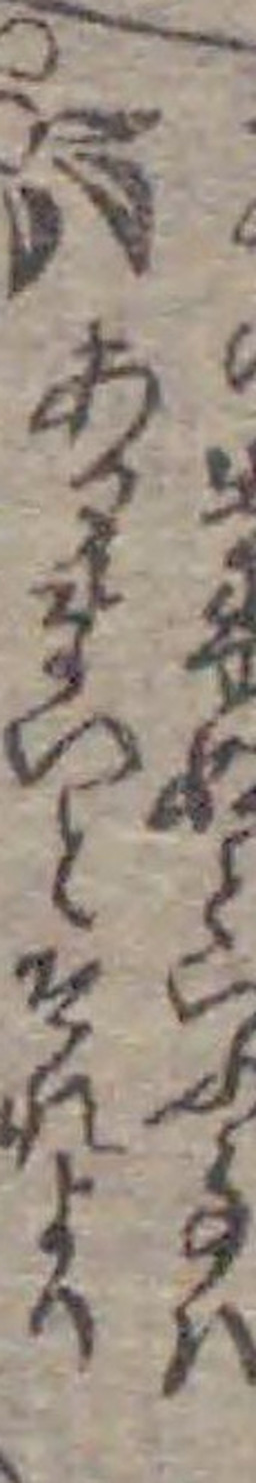あるまいとそれより
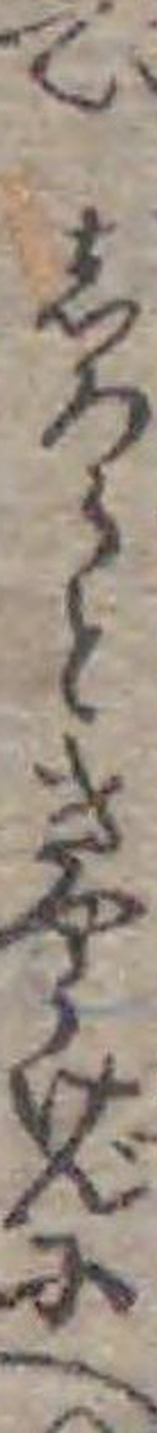しろうときやうげんに
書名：見徳一炊夢 : 3巻
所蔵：国立国会図書館 National Diet Library, JAPAN
